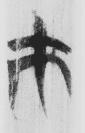巿
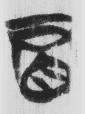冒
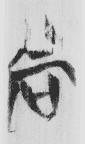尚
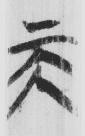天
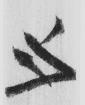之
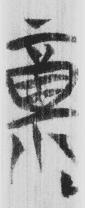福
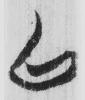㠯（以）
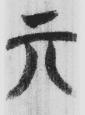亓
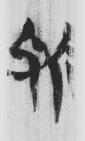斧
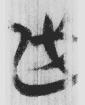戉
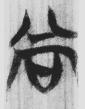尚
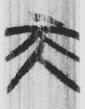天
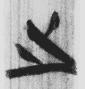之
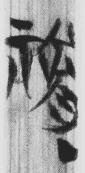禍
